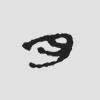月
